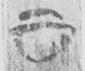百
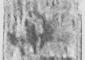卅
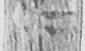二
